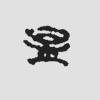星
